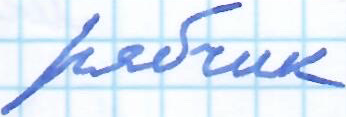рябчик
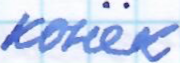конёк
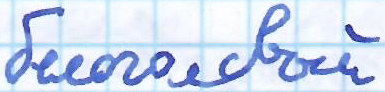белоголовый
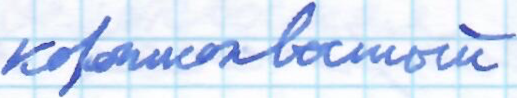короткохвостый
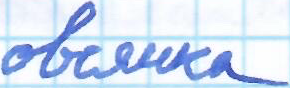овсянка
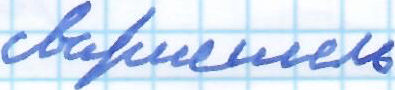свиристель
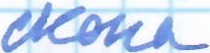скопа
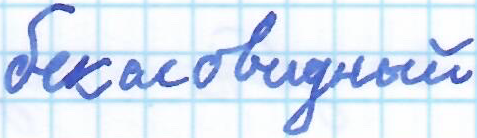бекасовидный
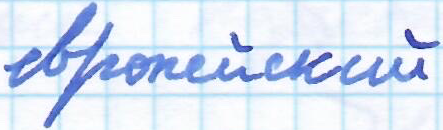европейский
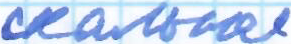скальная
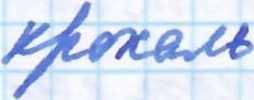крохаль
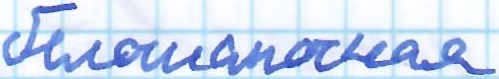белошапочная
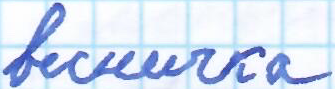весничка
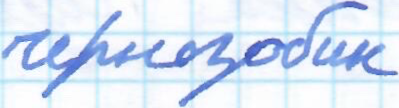чернозобик
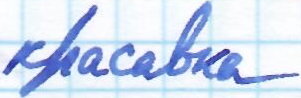красавка
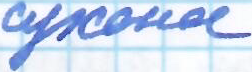сухонос
